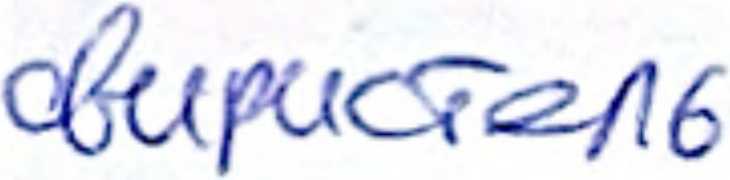свиристель
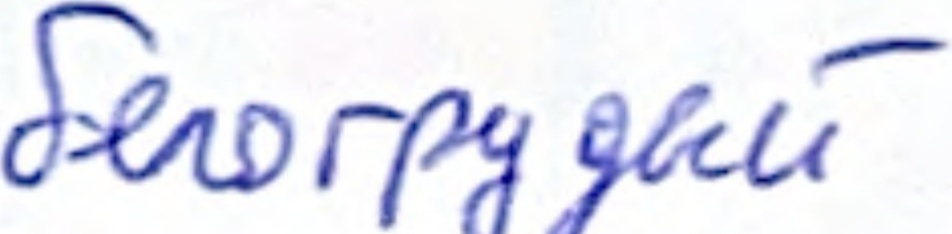белогрудый
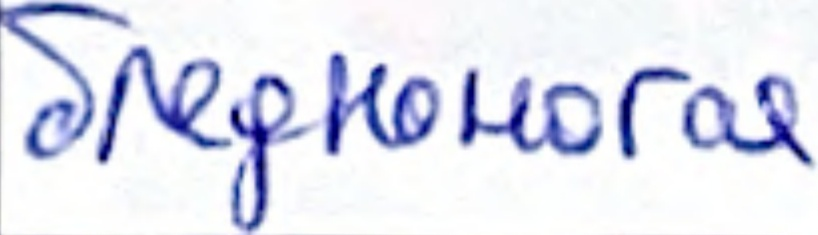бледноногая
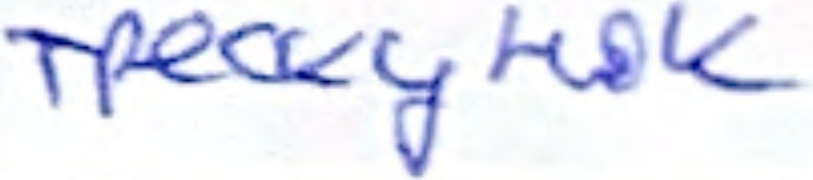трескунок
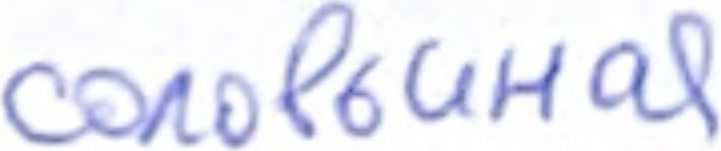соловьиная
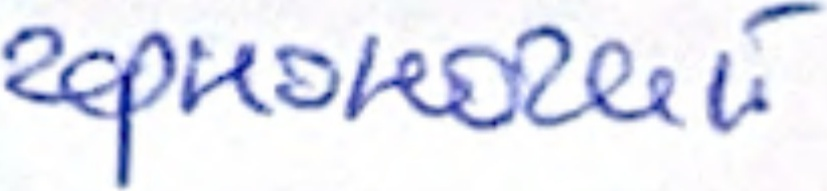черноногий
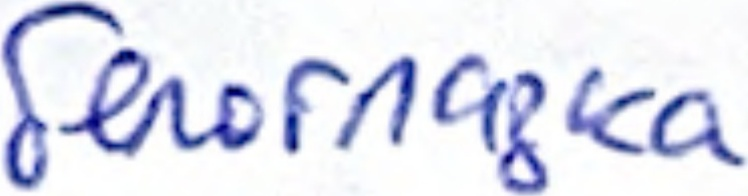белоглазка
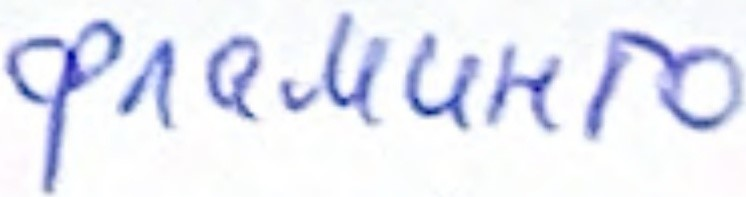фламинго
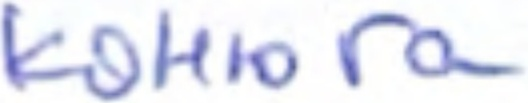конюга
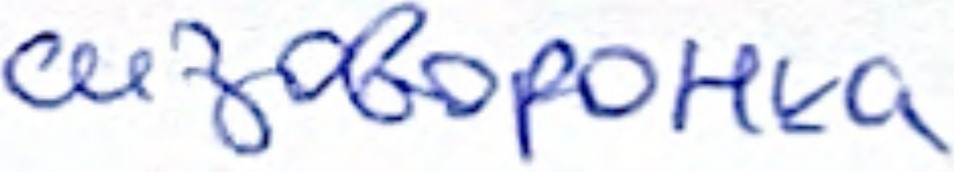сизоворонка
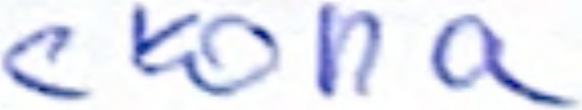скопа
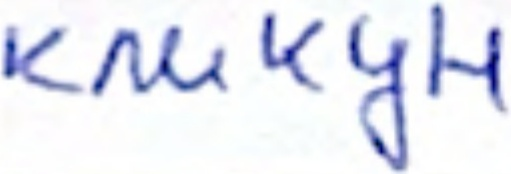кликун
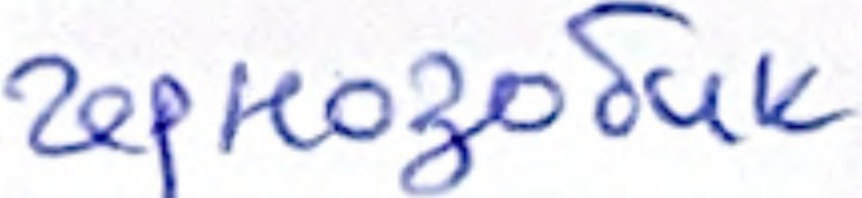чернозобик
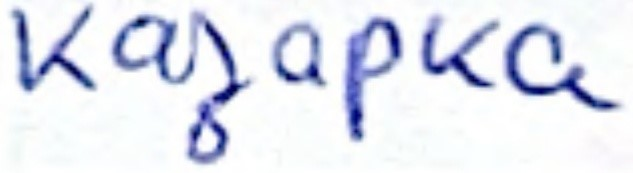казарка
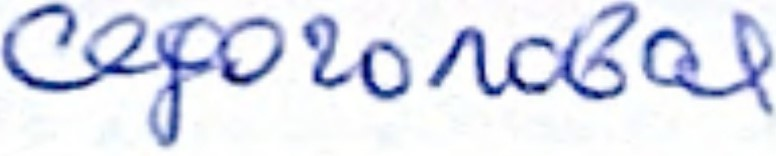седоголовая
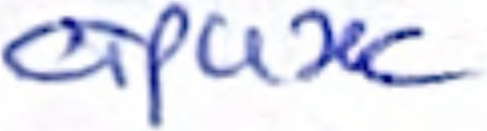стриж
